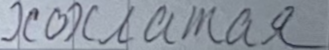хохлатая
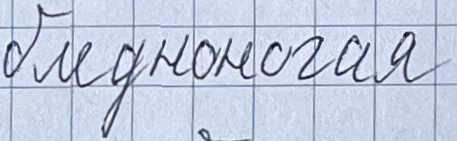бледноногая
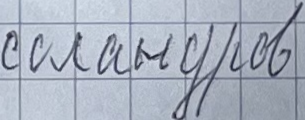соландров
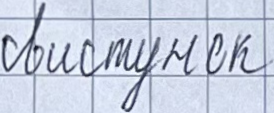свистунок
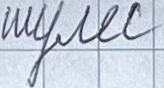тулес
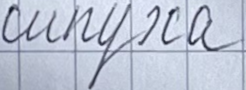сипуха
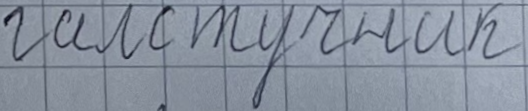галстучник
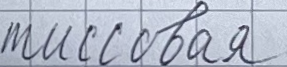тиссовая
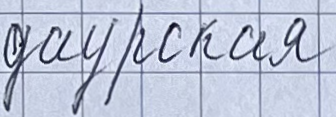даурская
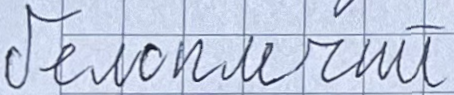белоплечий
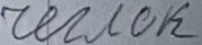чеглок
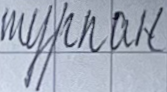турпан
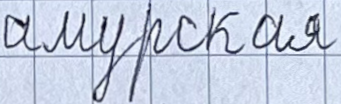амурская
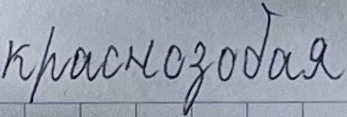краснозобая
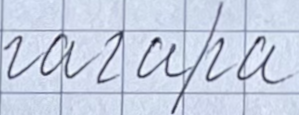гагара
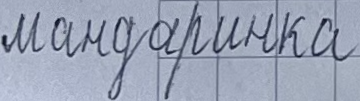мандаринка
